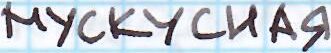мускусная
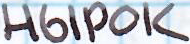нырок
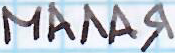малая
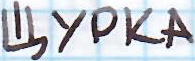щурка
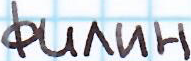филин
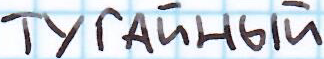тугайный
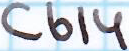сыч
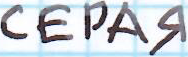серая
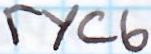гусь
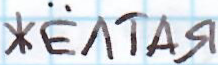жёлтая
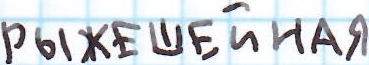рыжешейная
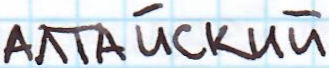алтайский
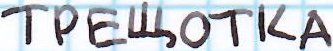трещотка
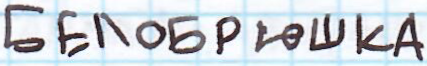белобрюшка
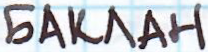баклан
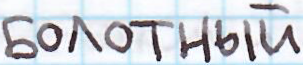болотный
